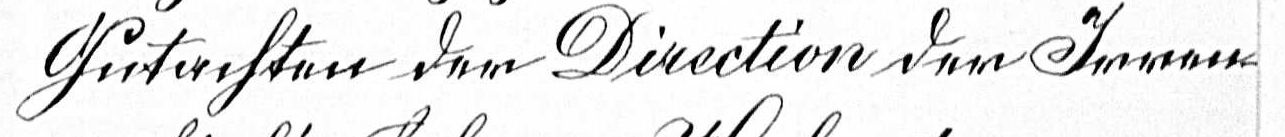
Gutachten der Direction der Irren¬
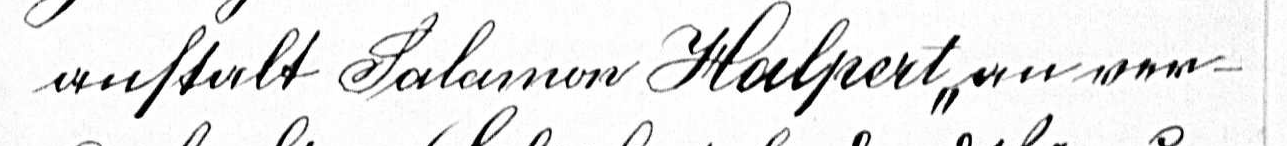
anstalt Salamon Halpert „an ver¬
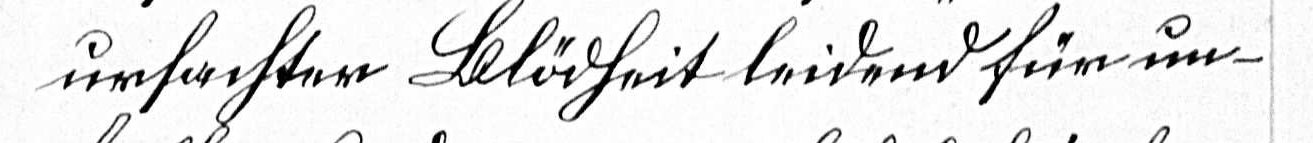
ursachter Blödheit leidend für un¬
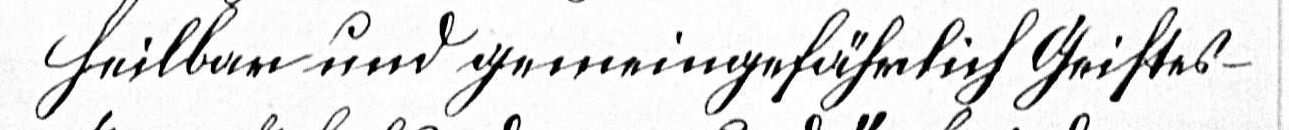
heilbar und gemeingefährlich Geistes¬
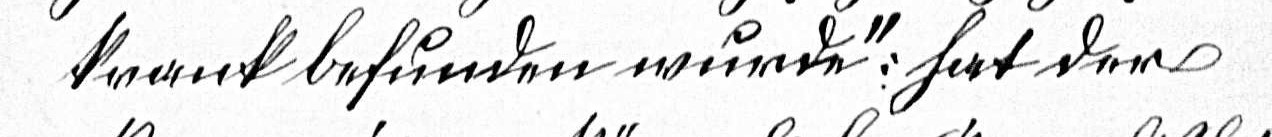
krank befunden wurde“: hat der
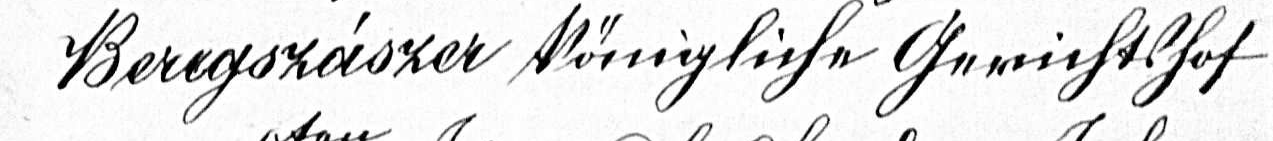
Beregszászer königliche Gerichtshof
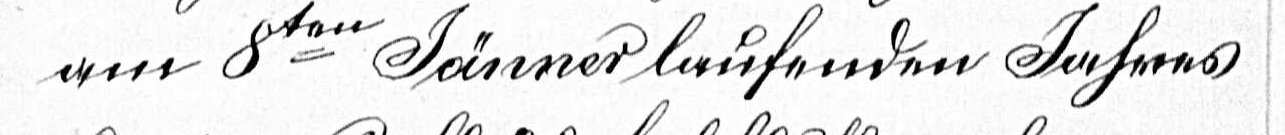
am 8ten Jänner laufenden Jahres
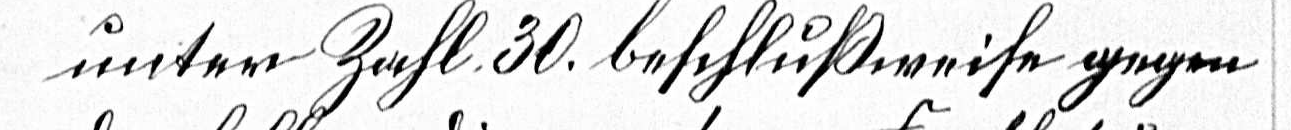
unter Zahl. 30. beschlußweise gegen
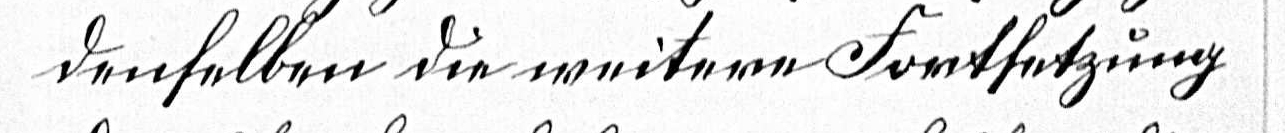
denselben die weitere Fortsetzung
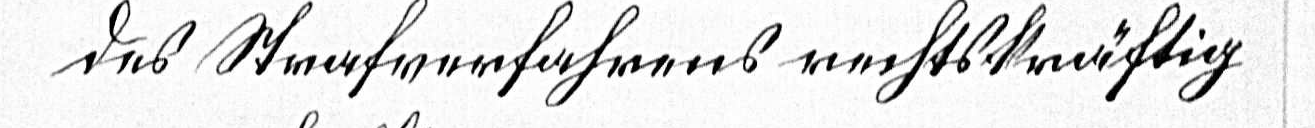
des Strafverfahrens rechtskräftig
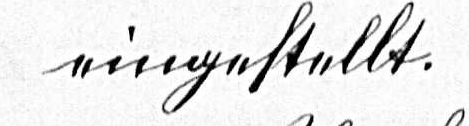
eingestellt.
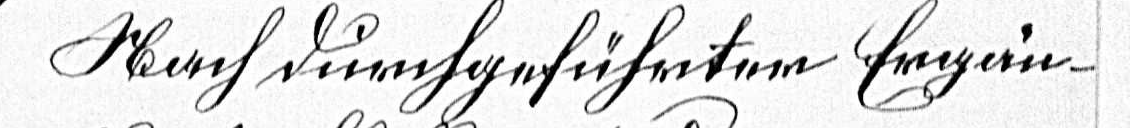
Nach durchgeführter Ergän¬
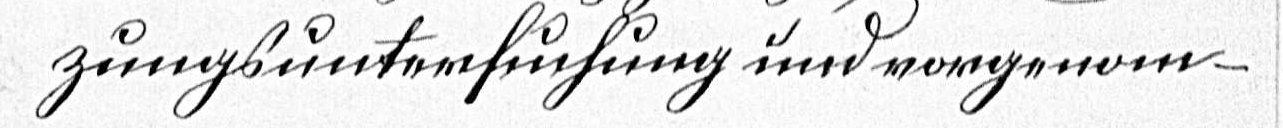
zungsuntersuchung und vorgenom¬
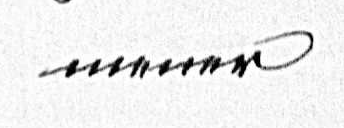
mener
